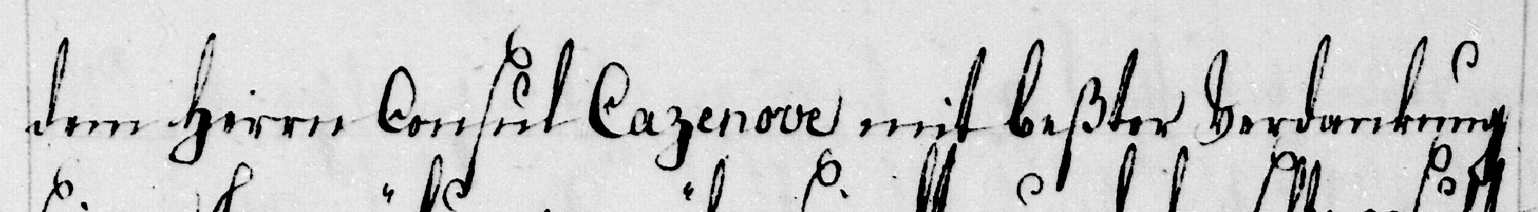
dem Herrn Consul Cazenove mit beßter Verdankung
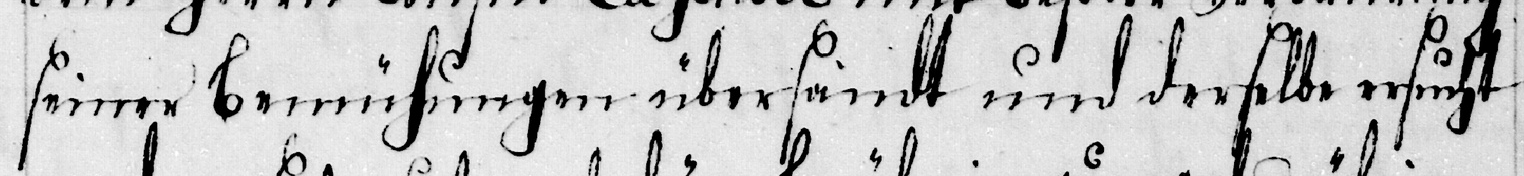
seiner Bemühungen übersendet und derselbe ersucht
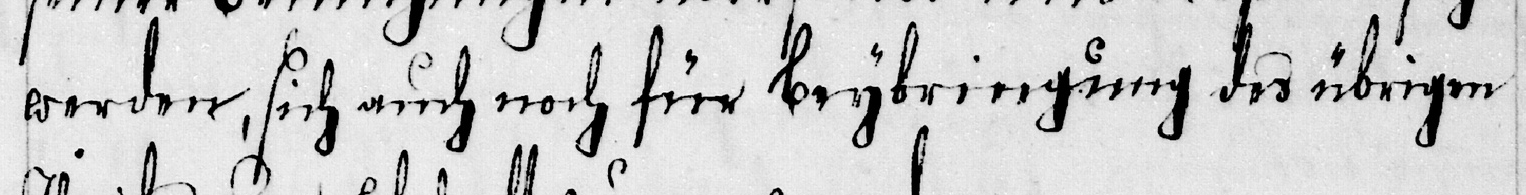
werden, sich auch noch für Beybringung des übrigen
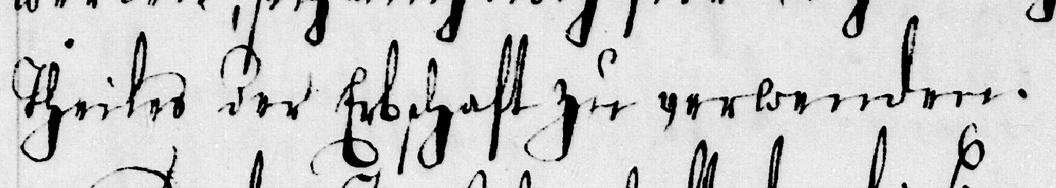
Theiles der Erbschaft zu verwenden.
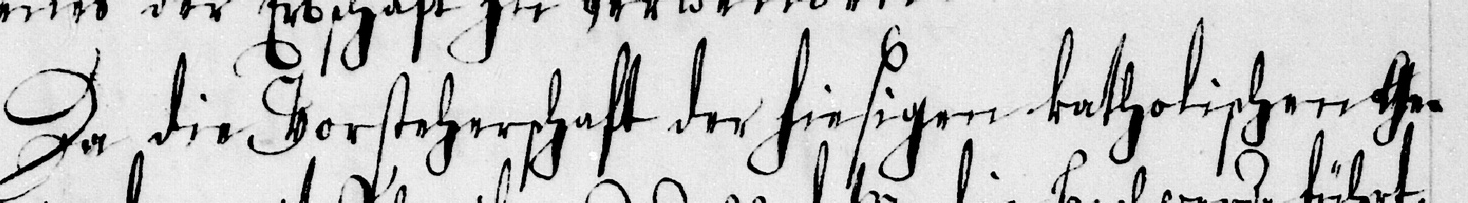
Da die Vorsteherschaft der hiesigen katholischen Gem¬
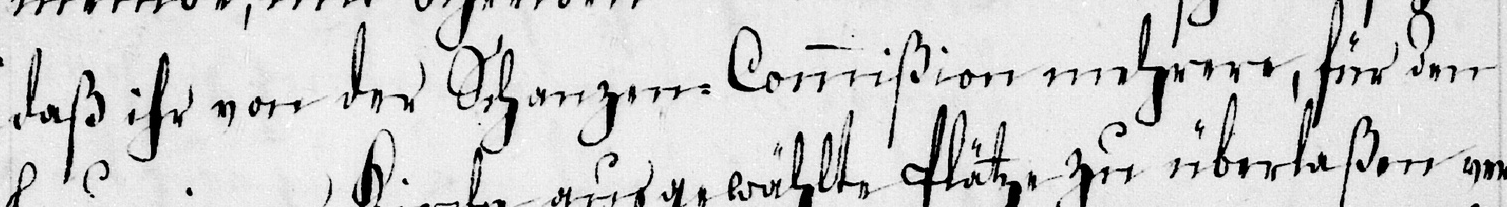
daß ihr von der Schanzen-Commißion mehrere, für den
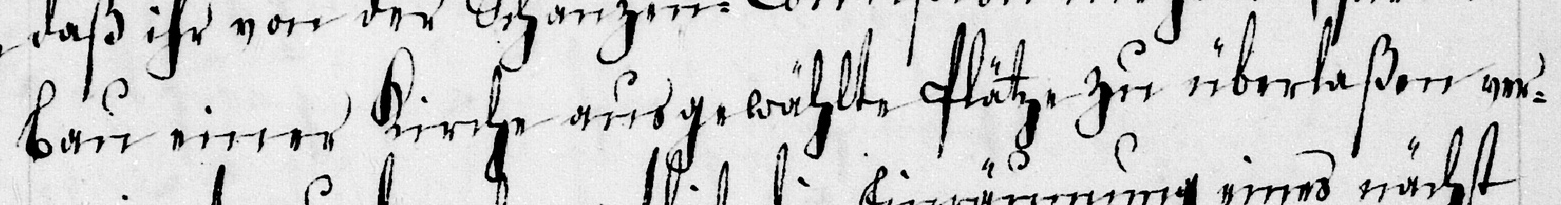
Bau einer Kirche ausgewählte Plätze zu überlaßen ver¬
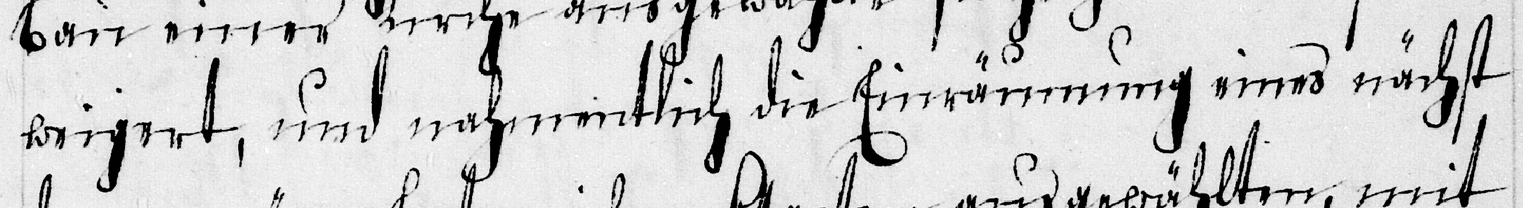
weigert, und nahmentlich die Einräumung eines nächst
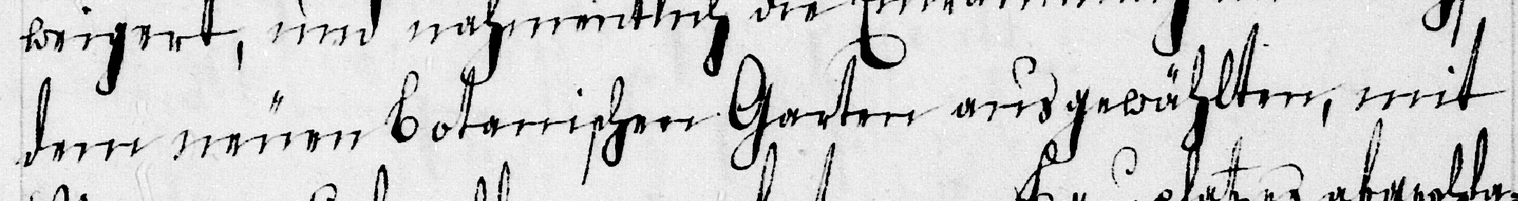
dem neuen Botanischen Garten ausgewählten, mit
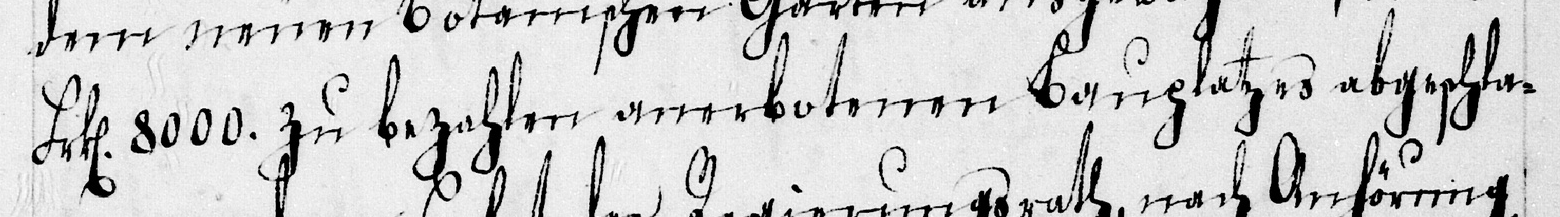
k[en]. 8000. zu bezahlen anerbotenen Bauplatzes abgeschla¬
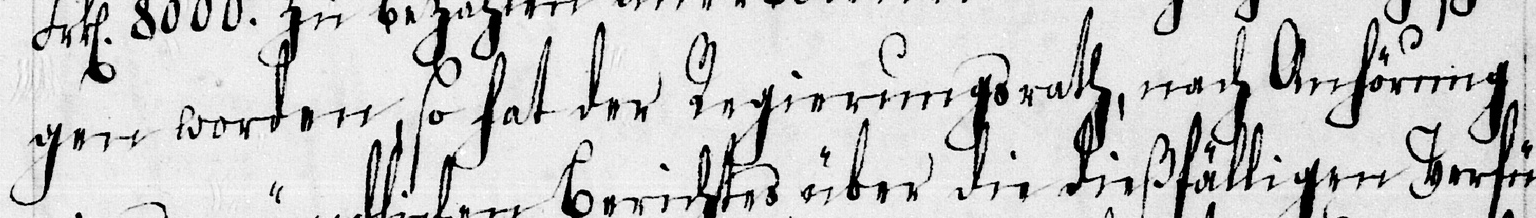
gen worden, so hat der Regierungsrath, nach Anhörung
